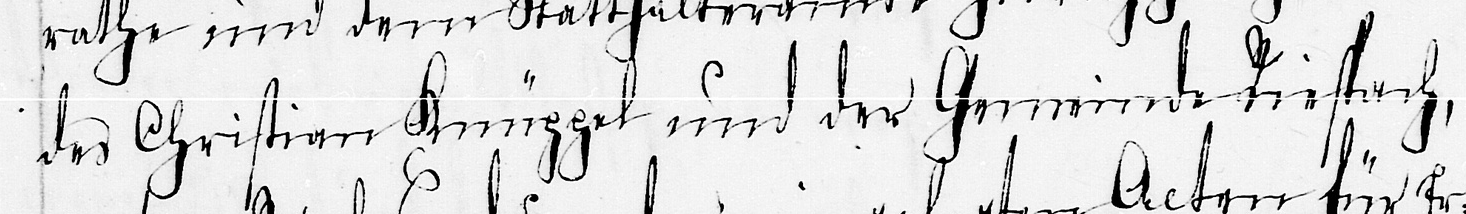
des Christian Knüppel und der Gemeinde Riespach,
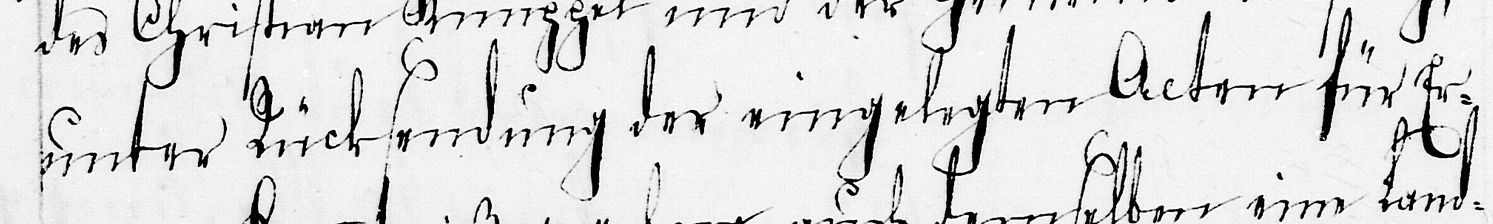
unter Rücksendung der eingelegten Acten für Er¬
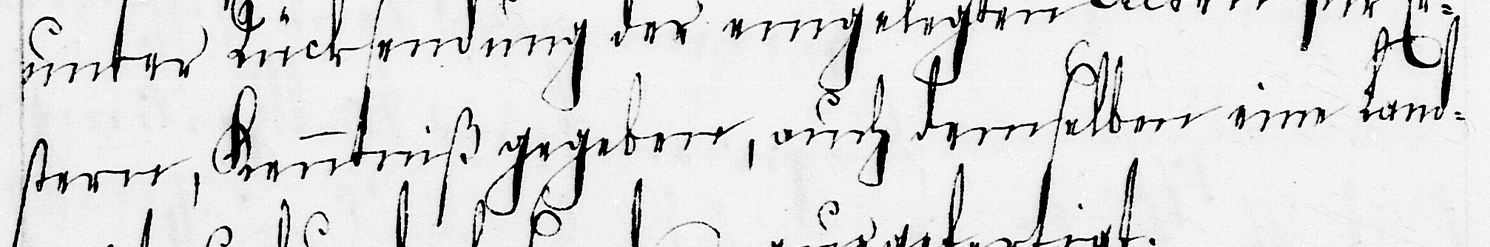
stern, Kenntniß gegeben, auch demselben eine Land¬
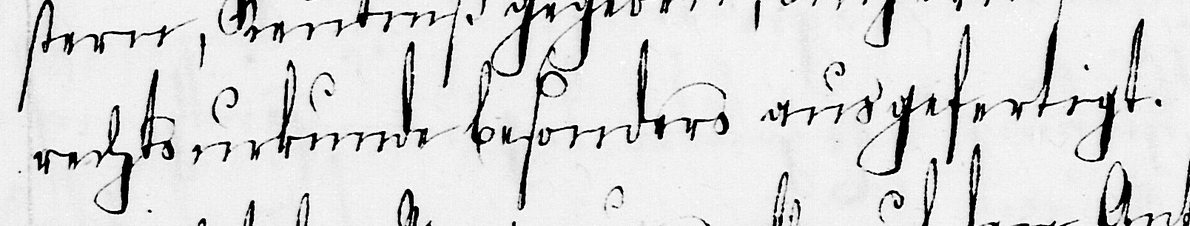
rechtsurkunde besonders ausgefertigt.
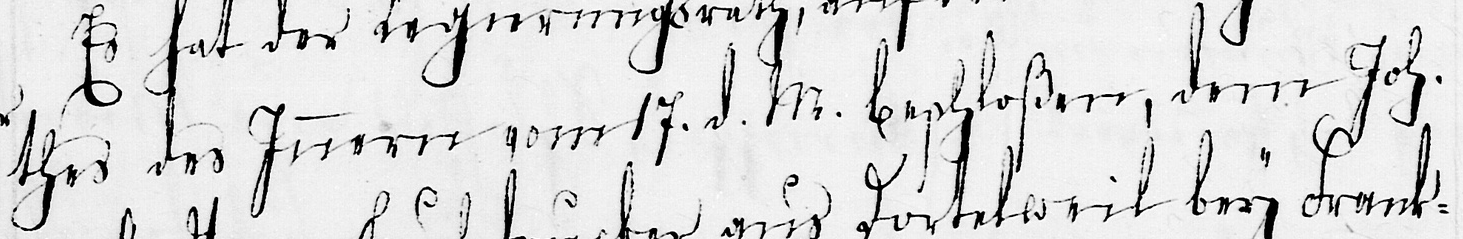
thes des Innern vom 17. d. M. beschloßen, dem Joh.
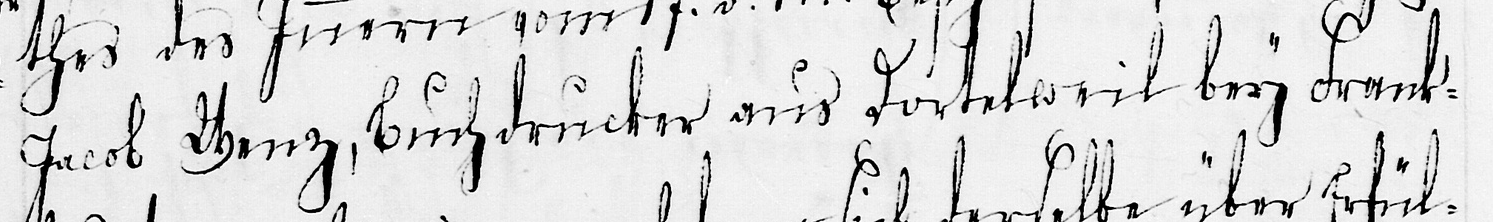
Jacob Wenz, Buchdrucker aus Dortelweil bey Frank¬
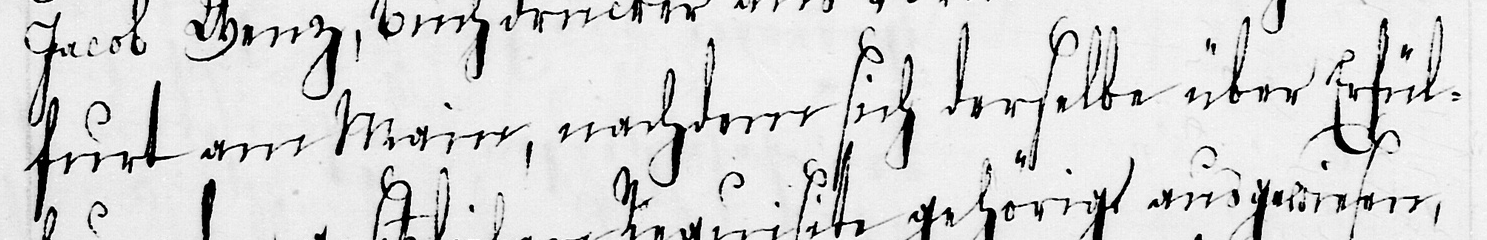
furt am Main, nachdem sich derselbe über Erfül¬
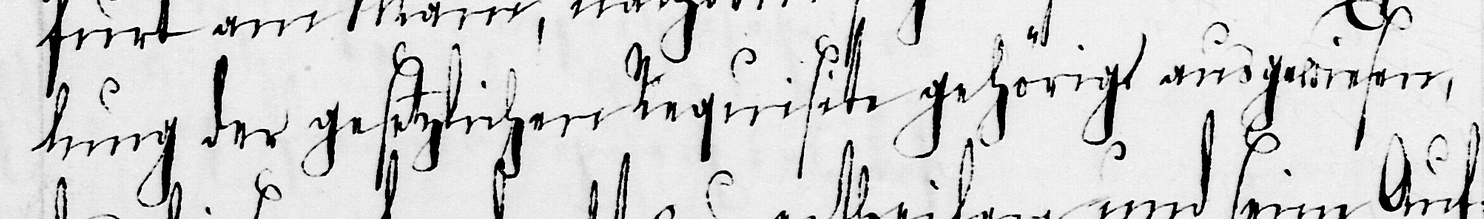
lung der gesetzlichen Requisite gehörig ausgewiesen,
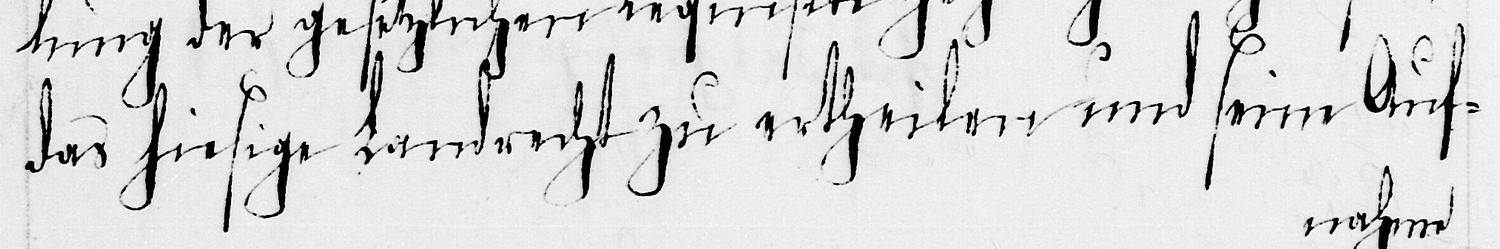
das hiesige Landrecht zu ertheilen und seine Auf-
